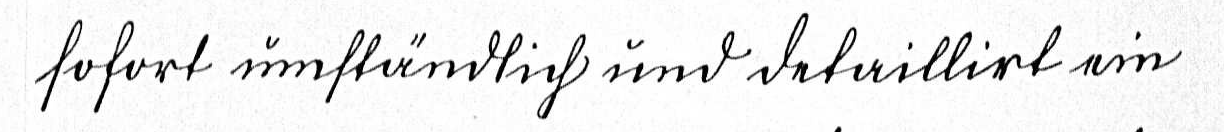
sofort umständlich und detaillirt ein
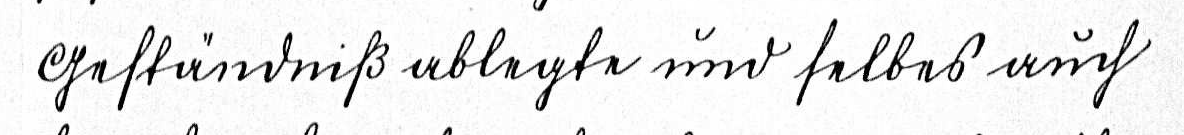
Geständniß ablegte und selbes auch
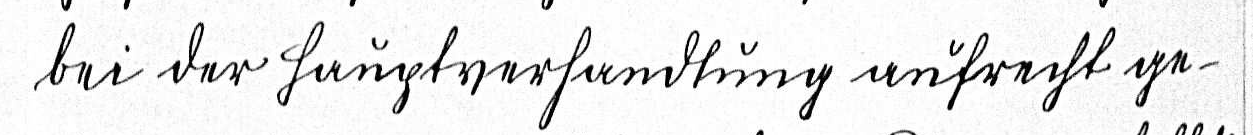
bei der Hauptverhandlung aufrecht ge¬
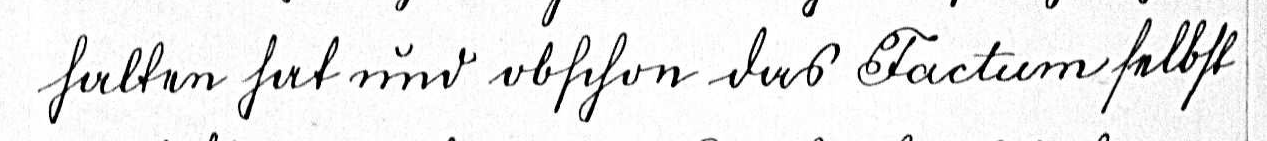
halten hat und obschon das Factum selbst
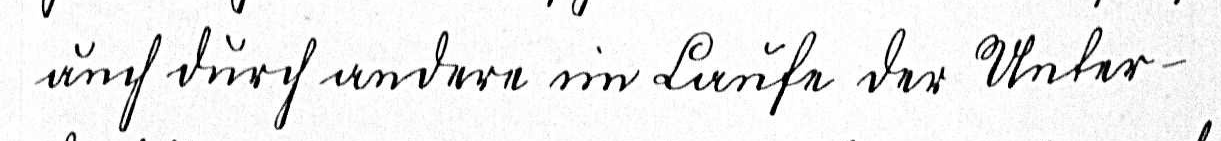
auch durch andere im Laufe der Unter¬
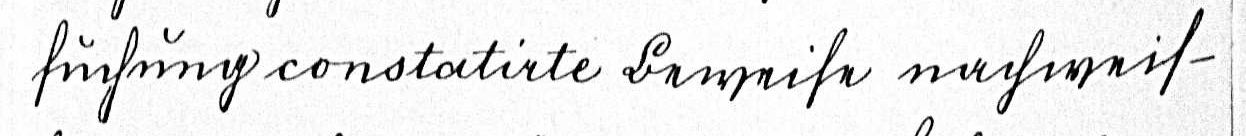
suchung constatirte Beweise nachweis¬
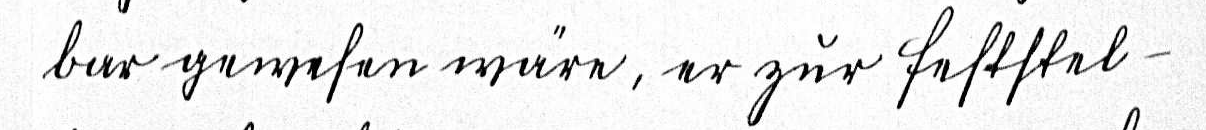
bar gewesen wäre, er zur Feststel¬
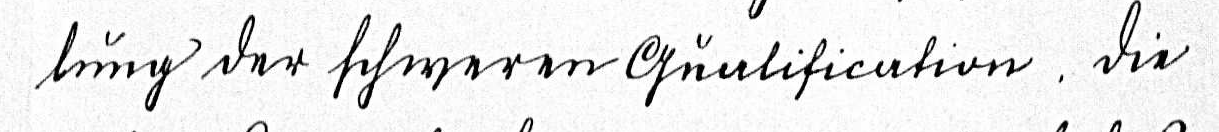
lung der schweren Qualification. Die
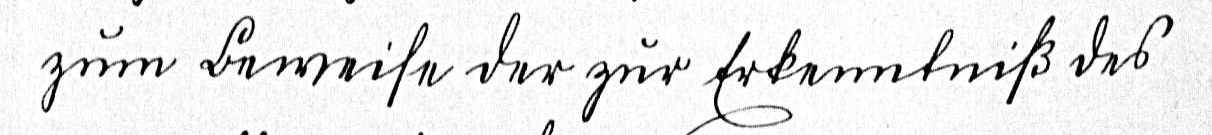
zum Beweise der zur Erkenntniß des
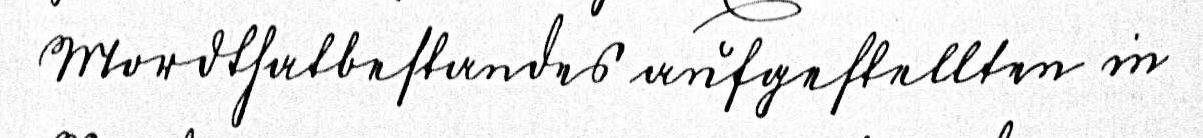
Mordthatbestandes aufgestellten in
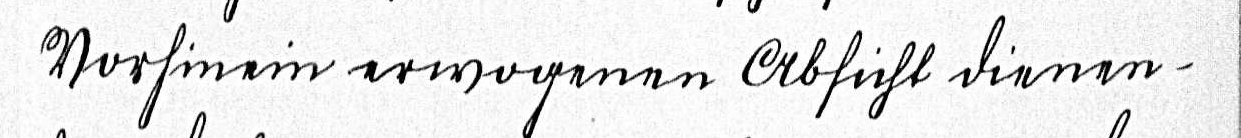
Vorhinein erwogenen Absicht dienen¬
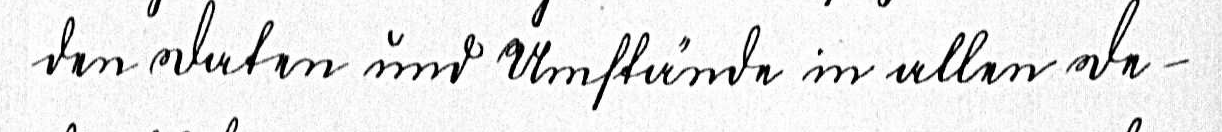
den Daten und Umstände in allen De¬
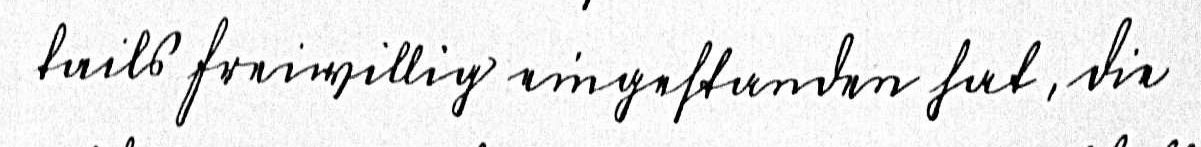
tails freiwillig eingestanden hat, die
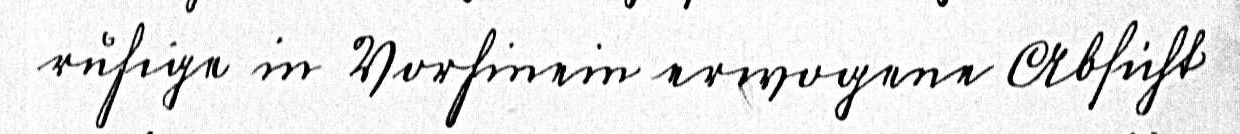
ruhige in Vorhinein erwogene Absicht
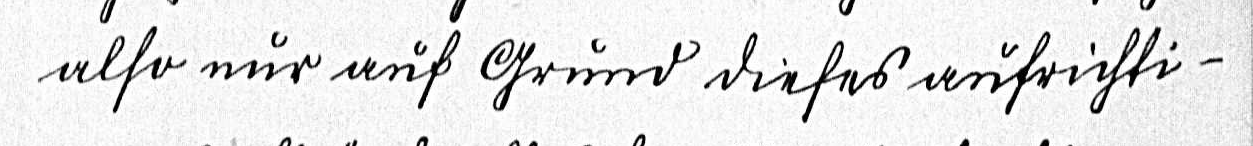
also nur auf Grund dieses aufrichti¬
